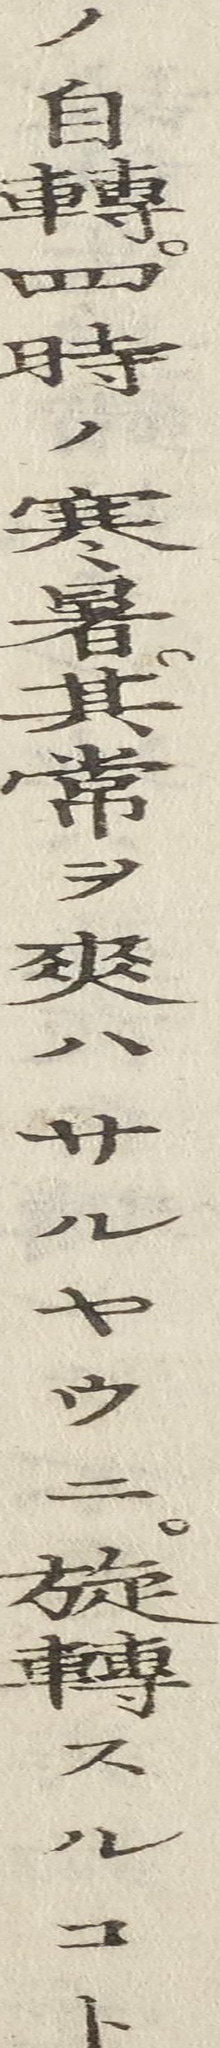ノ自転。四時ノ寒暑。其常ヲ爽ハサルヤウニ。旋転スルコト
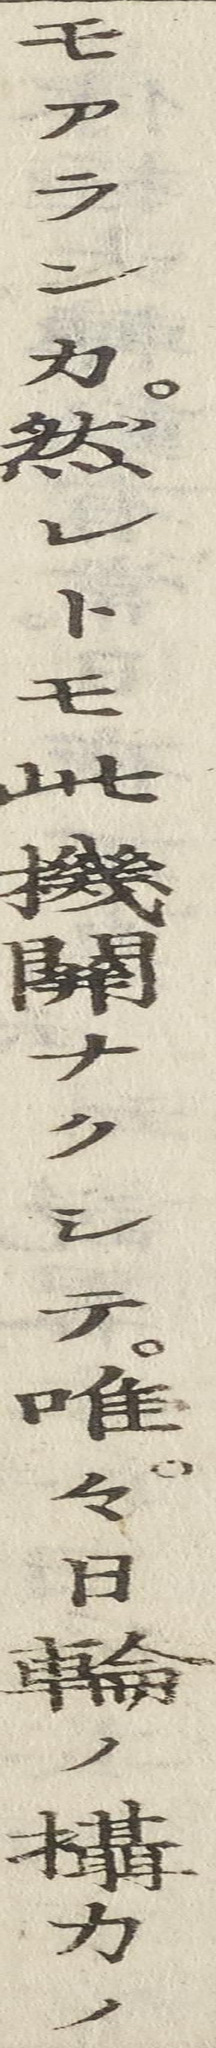モアランカ。然レトモ此機関ナクシテ。唯。々日輪ノ摂カノ
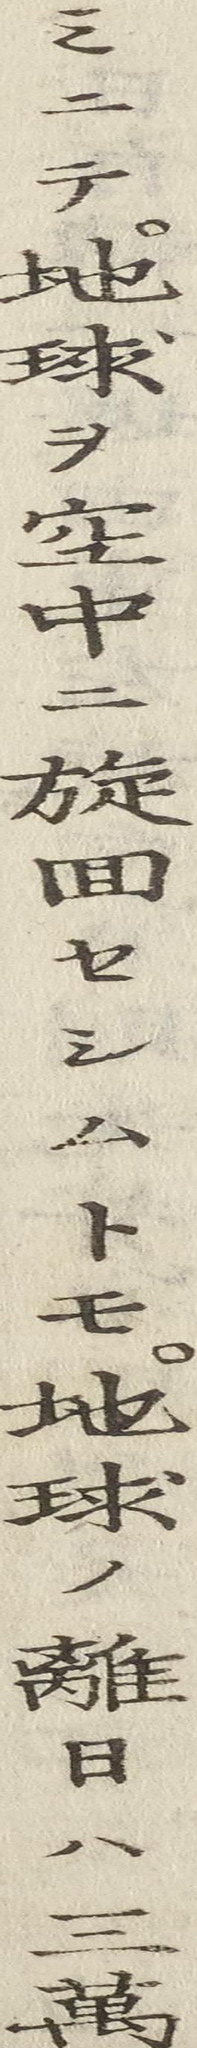ミニテ。地球ヲ空中ニ旋回セシムトモ。地球ノ離日ハ三万
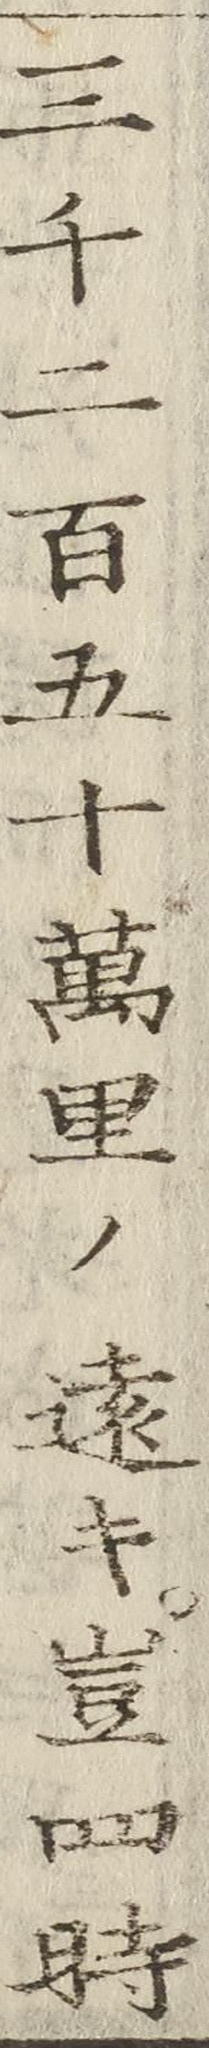三千二百五十万里ノ遠キ。豈四時
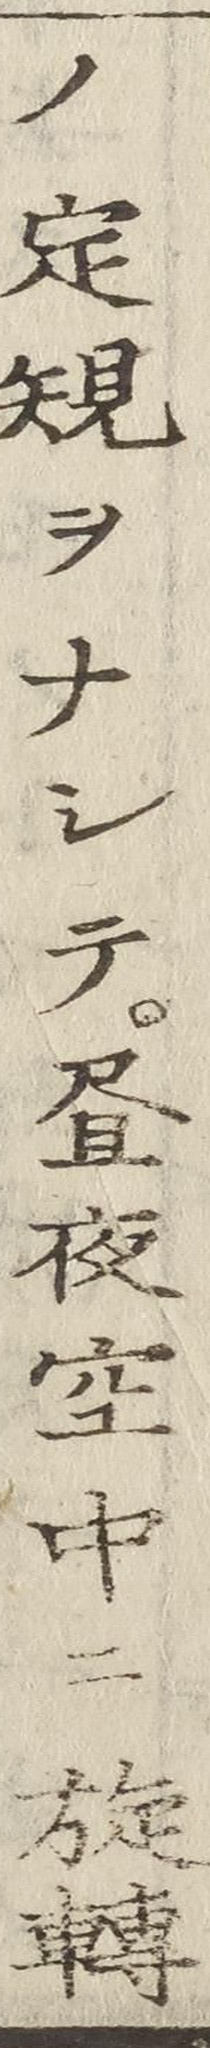ノ定規ヲナシテ。昼夜空中ニ旋転
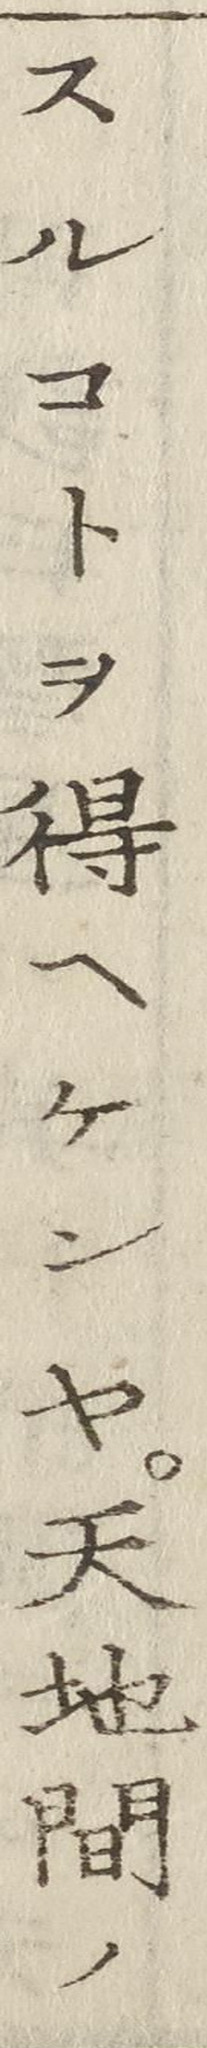スルコトヲ得ヘケンヤ。天地間ノ
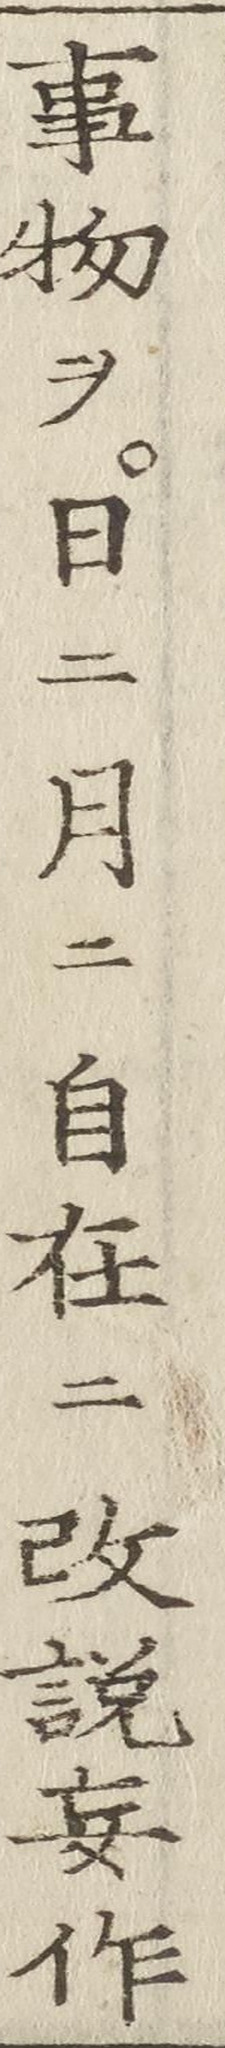事物ヲ。日ニ月ニ自在ニ改説妄作
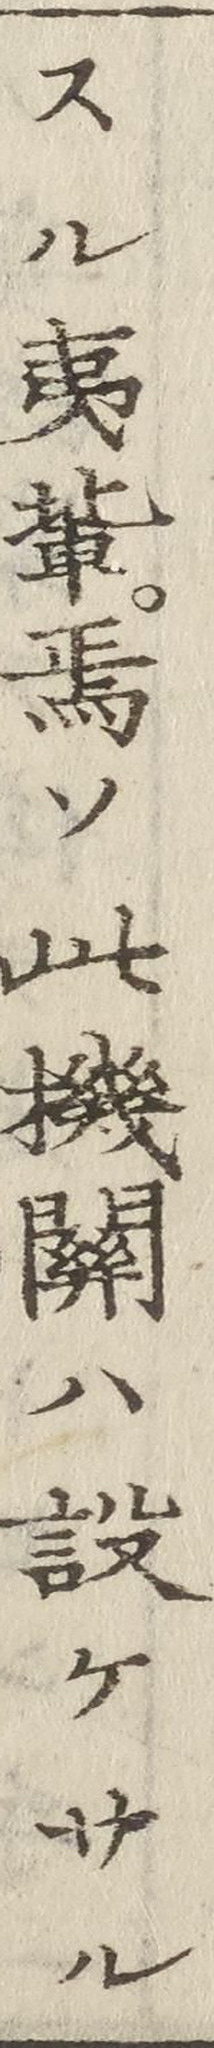スル夷輩。焉ソ此機関ハ設ケサル
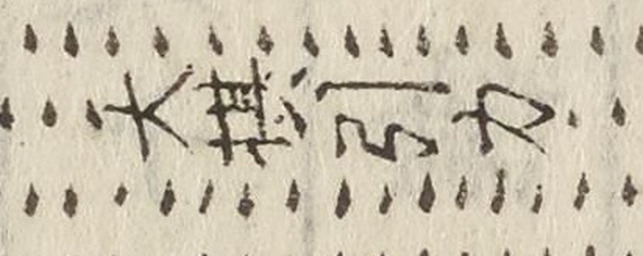大摂引力
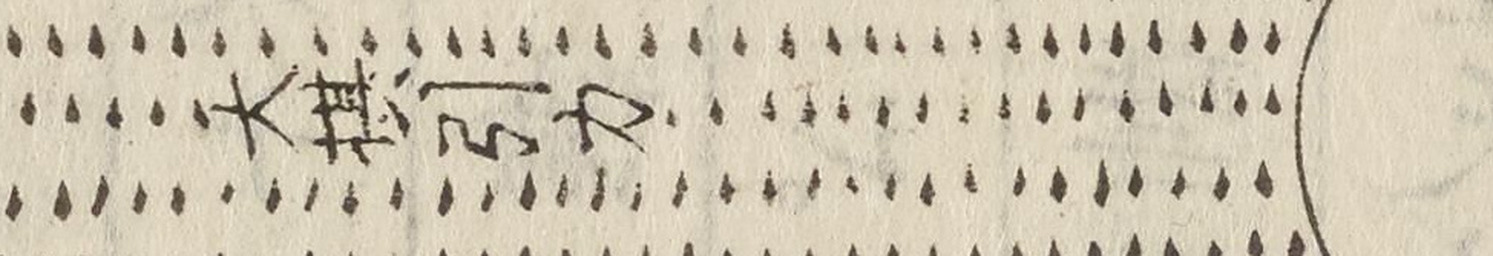大摂引力
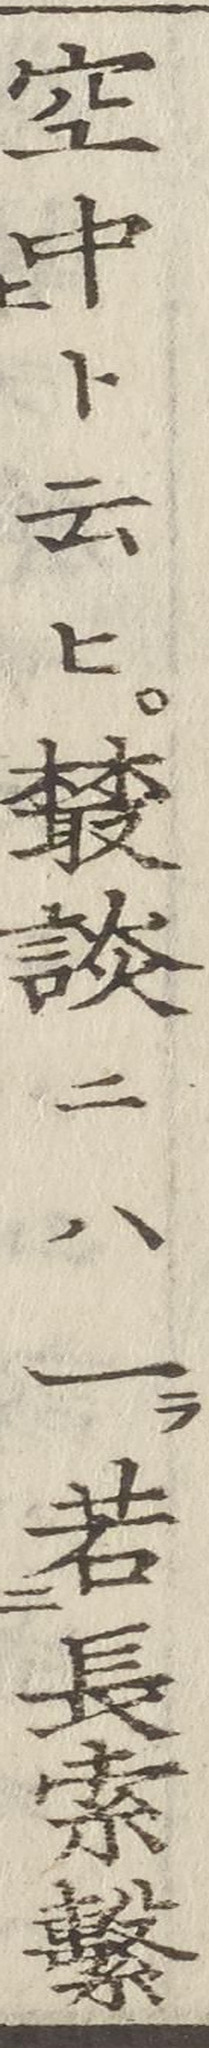空中ト云ヒ。樷談ニハ一若ニ長索繋
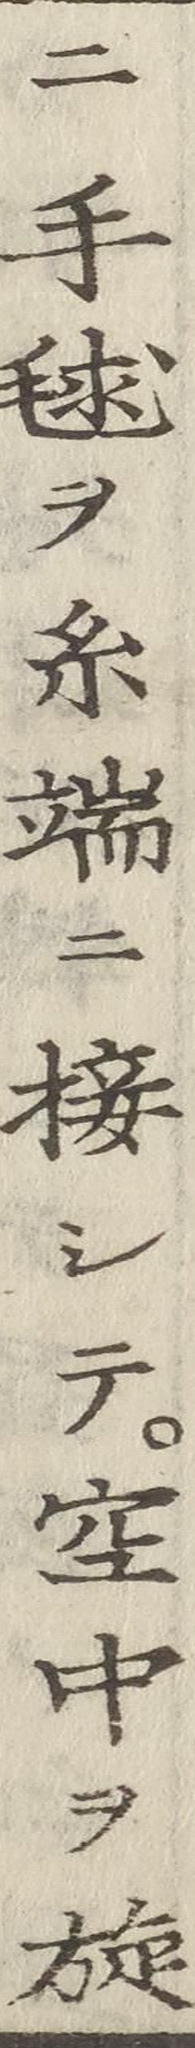ニ手毬ヲ糸端ニ接シテ。空中ヲ旋
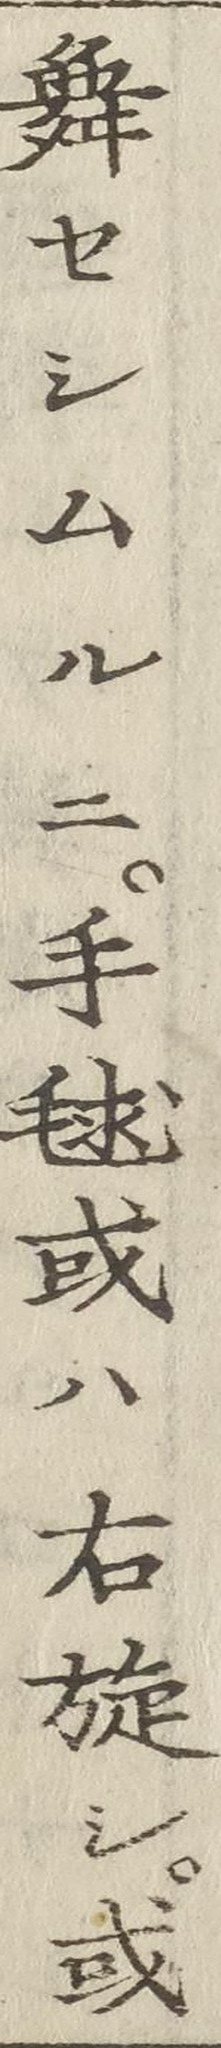舞セシムルニ。手毬或ハ右旋シ。或

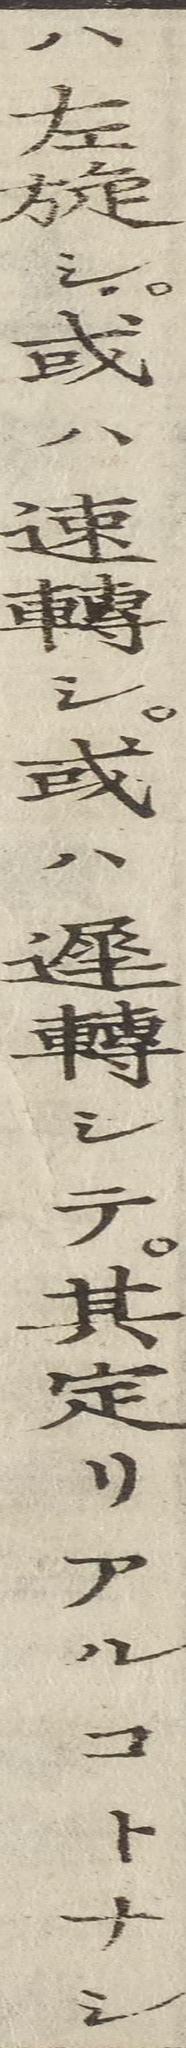ハ左旋シ。或ハ速転シ。或ハ遅転シテ。其定リアルコトナシ。
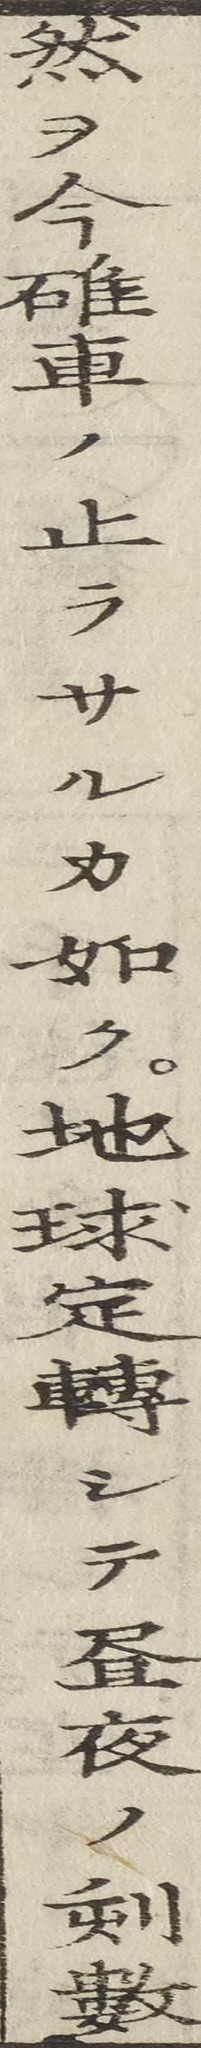然ヲ今碓車ノ止ラサルカ如ク。地球定転シテ昼夜ノ刻数
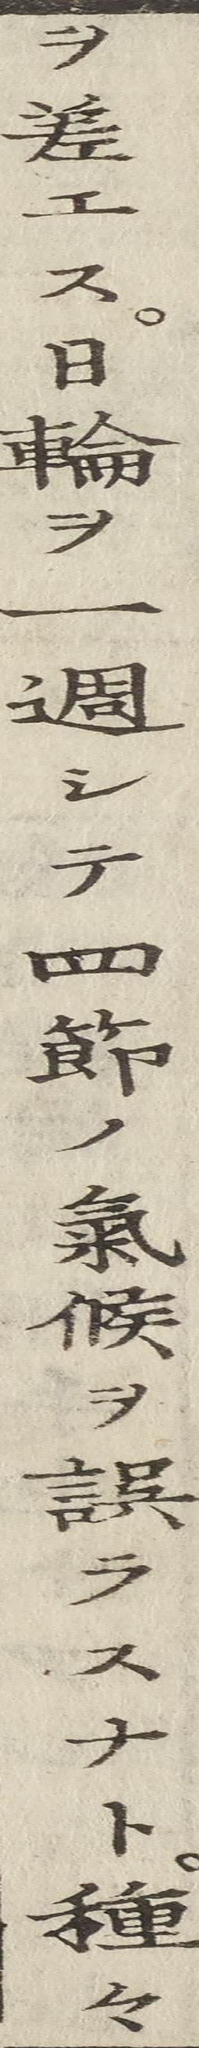ヲ差エス。日輪ヲ一週シテ四節ノ気候ヲ誤ラスナト。種々
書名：護法新論　二編　下
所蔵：東京大学地震研究所図書室 Earthquake Research Institute Library, The University of Tokyo, JAPAN
